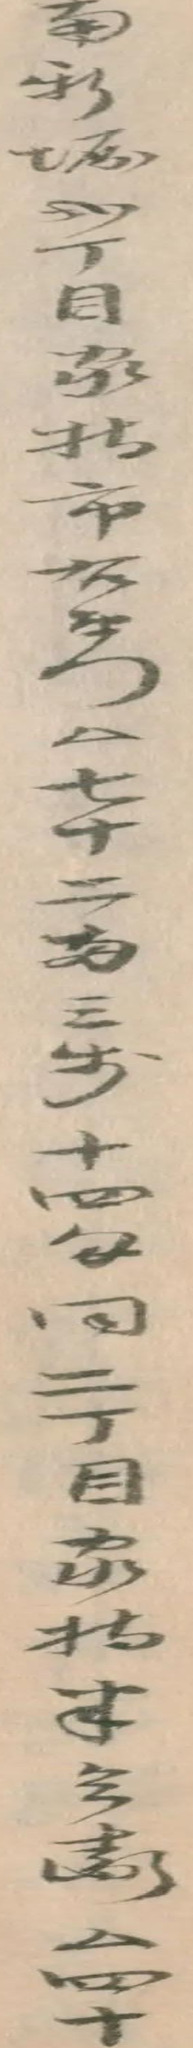南新堀弐丁目家持市右衛門△七十二両三歩十四匁同二丁目家持半兵衛△四十
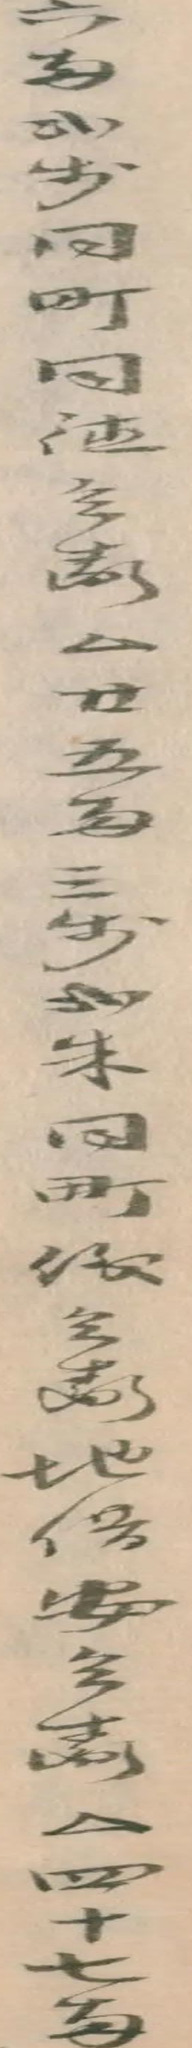六両弐歩同町同徳兵衛△廿五両三歩弐朱同町儀兵衛地借安兵衛△四十七両
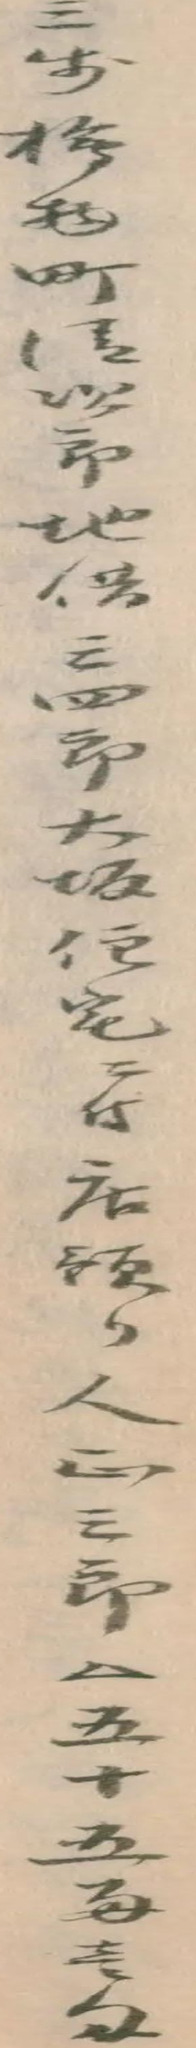三歩檜物町清次郎地借三四郎大坂住宅付店預り人正三郎△五十五両壱匁
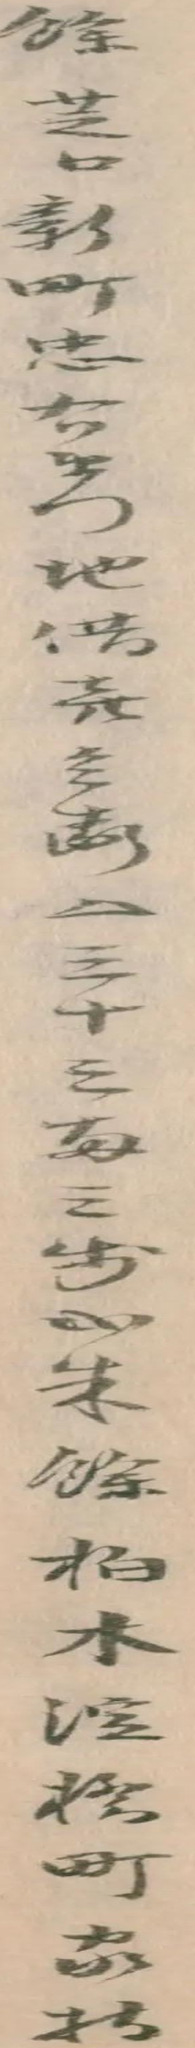余芝口新町忠右衛門地借喜兵衛△三十三両三歩弐朱余柏木淀橋町家持
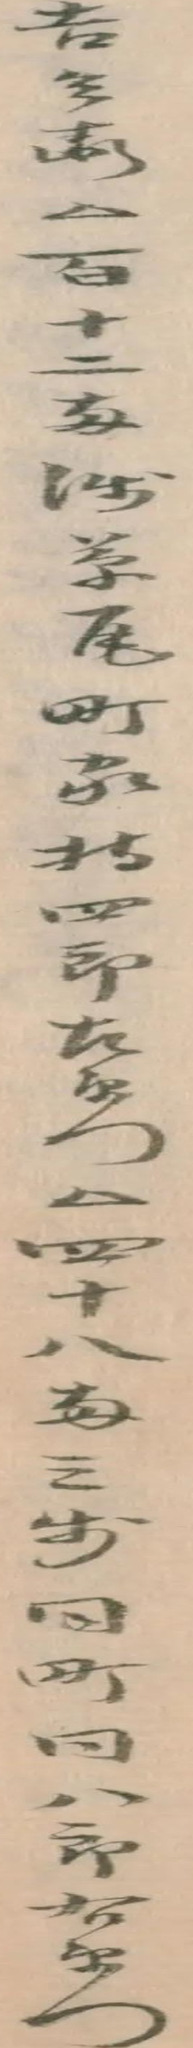吉兵衛△百十二両浅草瓦町家持四郎左衛門△四十八両三歩同町同八郎右衛門
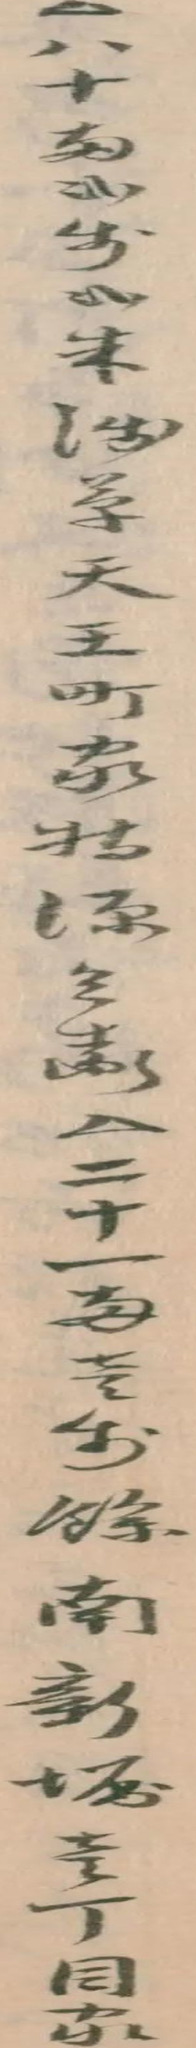△八十両弐歩弐朱浅草天王寺家持源兵衛△二十一両壱歩余南新堀壱丁目家
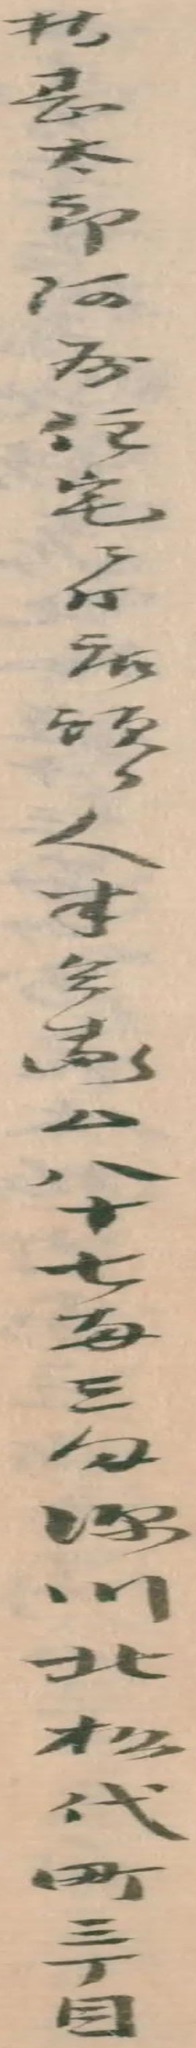持甚太郎阿州住宅付店預り人半兵衛△八十七両三匁深川北松代町三丁目
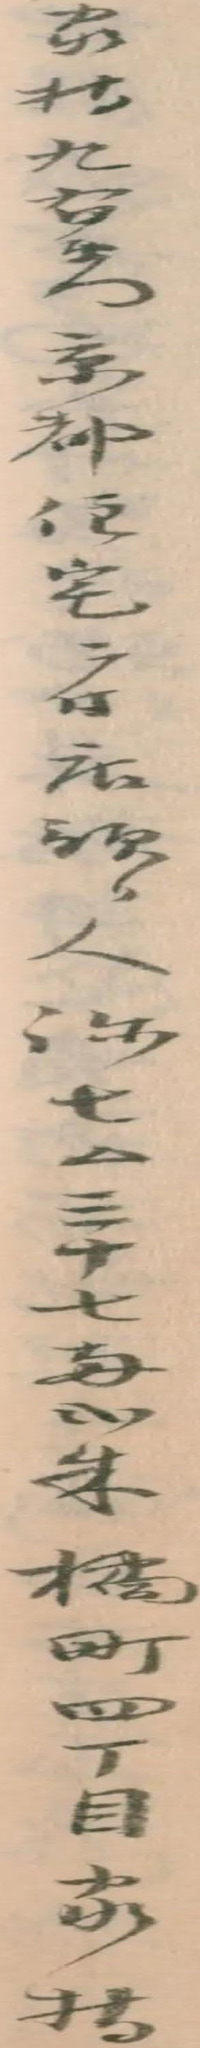家持九右衛門京都住宅付店預り人弥七△三十七両弐朱橘町四丁目家持
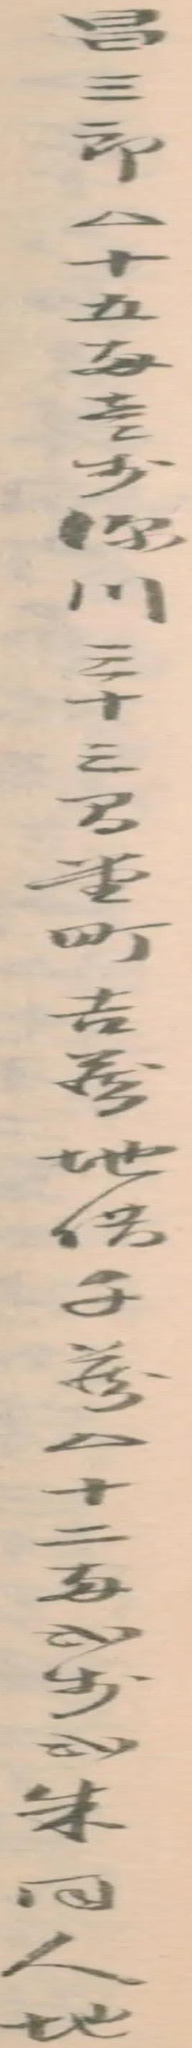昌三郎△十五両壱歩深川三十三間堂町吉蔵地借千蔵△十二両弐歩弐朱同人地
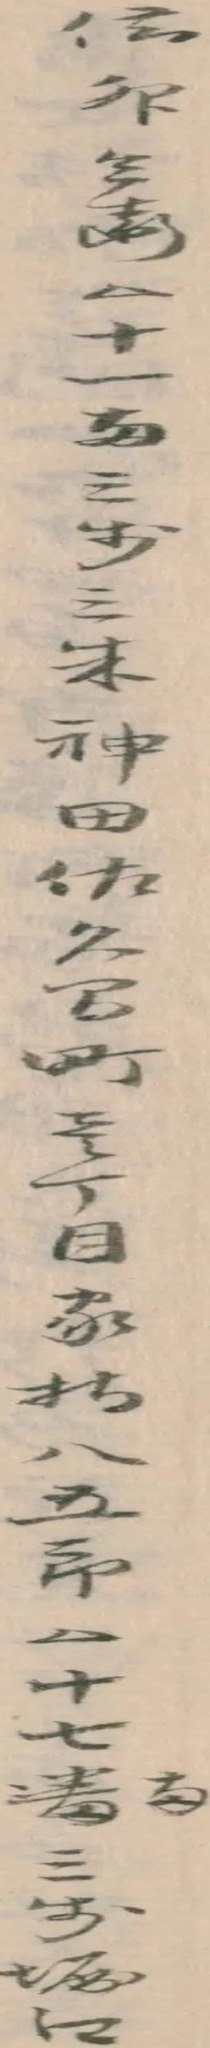借卯兵衛△十一両三歩三朱神田佐久間町壱丁目家持八五郎△十七番三歩堀江
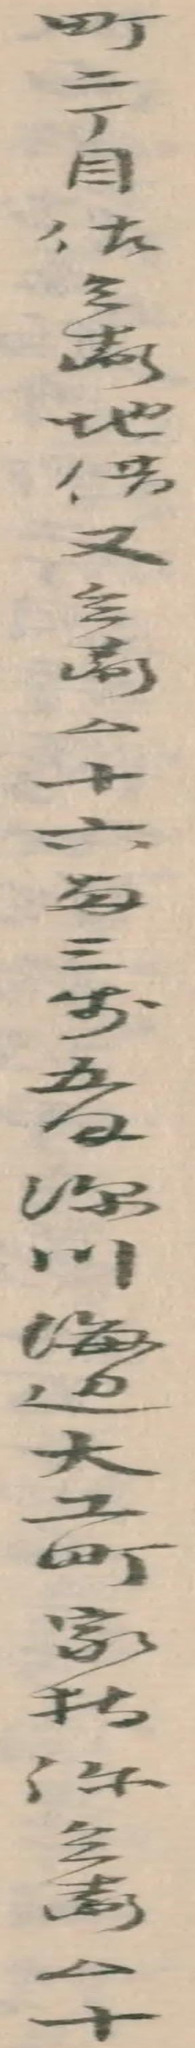町二丁目佐兵衛地借又兵衛△十六両三歩五匁深川海辺大工町家持弥兵衛△十
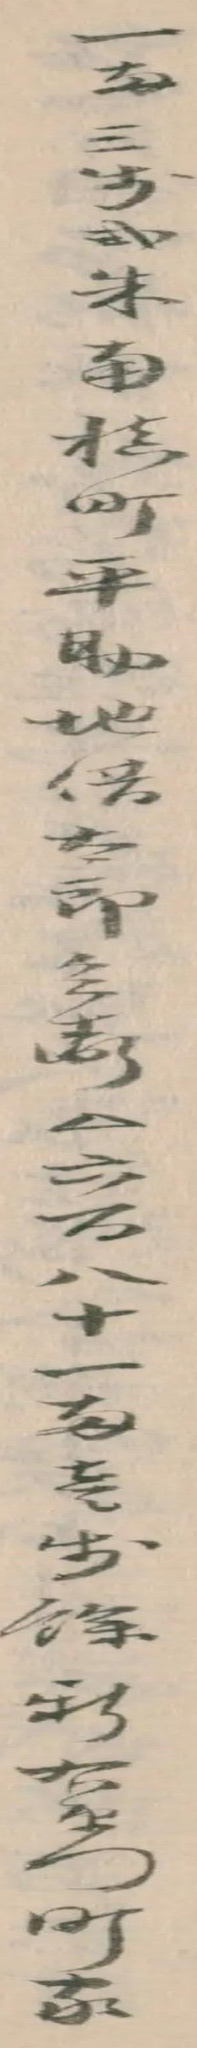一両三歩弐朱南槙町平助地借太郎兵衛△六百八十一両壱歩余新右衛門家
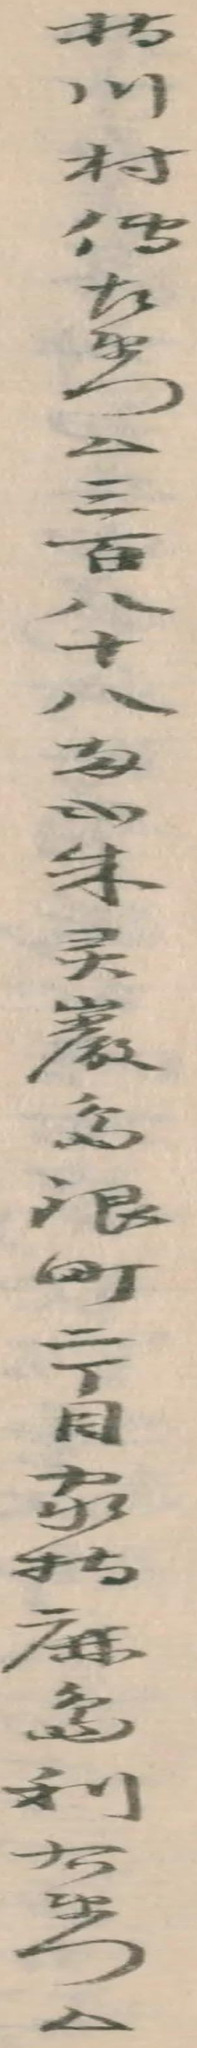持川村伝左衛門△三百八十八両弐朱霊巖島銀町二丁目家持鹿島利右衛門△
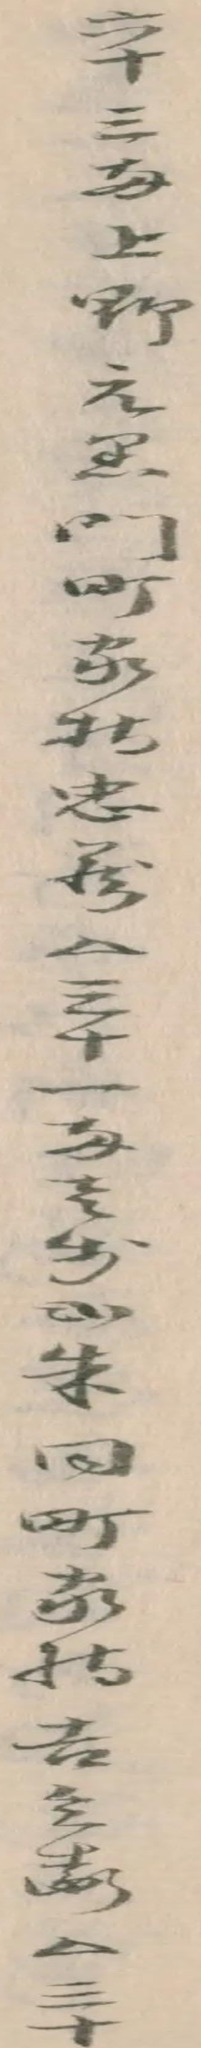六十三両上野元黒門町家持忠蔵△三十一両壱歩弐朱同町家持吉兵衛△三十
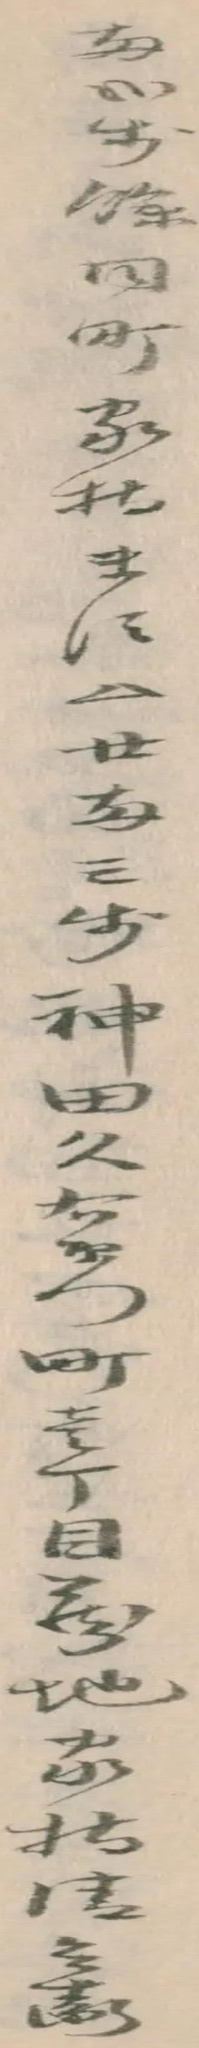両弐歩余同町家持ます△廿両三歩神田久右衛門町壱丁目蔵地家持清兵衛
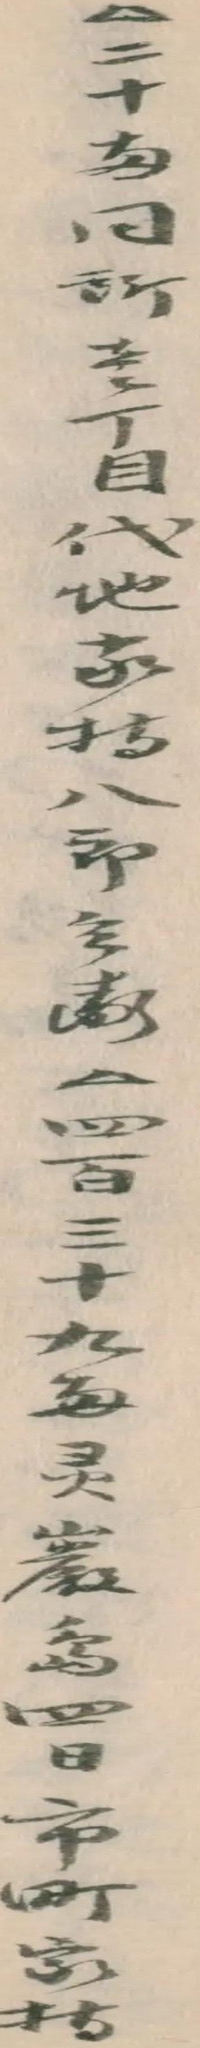△二十両同所壱丁目代地家持八郎兵衛△四百三十九両霊巖島四日市町家持
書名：地災撮要. 巻10(地震之部) 上,下
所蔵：国立国会図書館 National Diet Library, JAPAN
